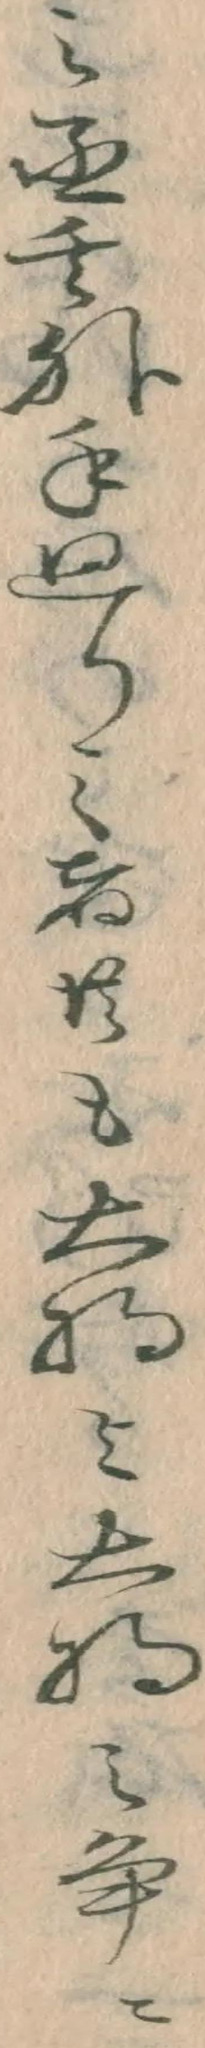之丞其外手廻り之者共も大将与大将之争に
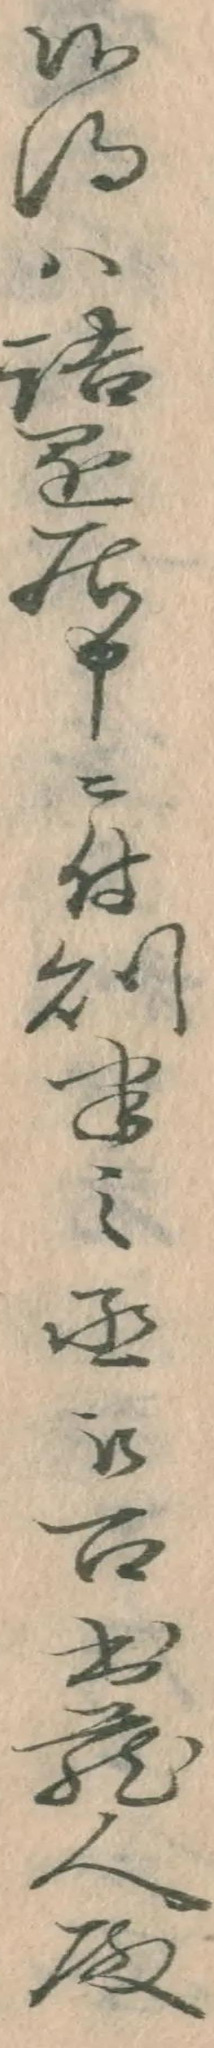候得は詰懸居申に付則半之丞被召出蔵人殿
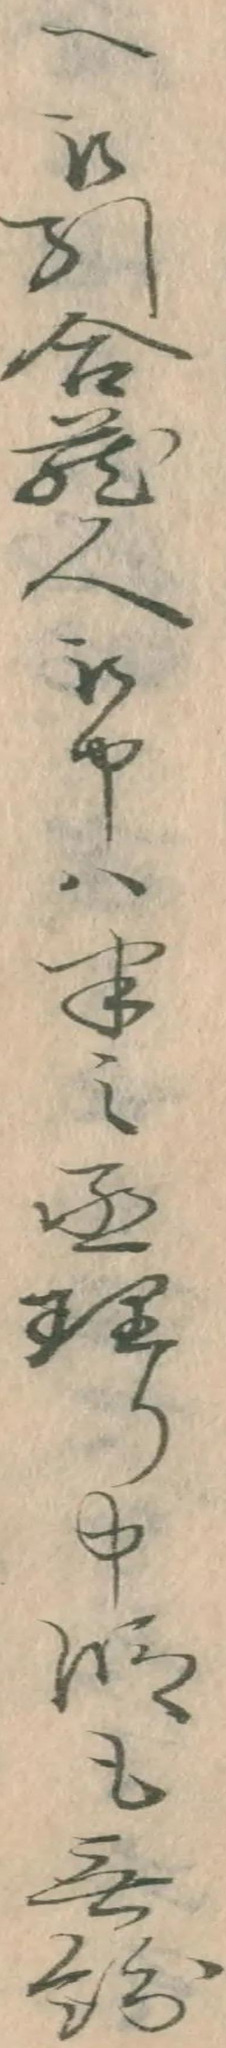へ被引合蔵人被申は半之丞理り申段も無紛
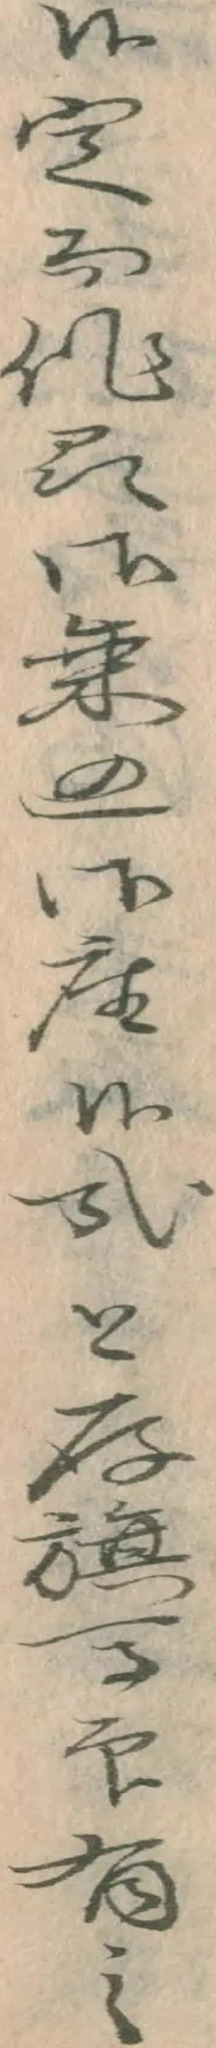候定而作州御乗込御座候哉と存旗馬印有之

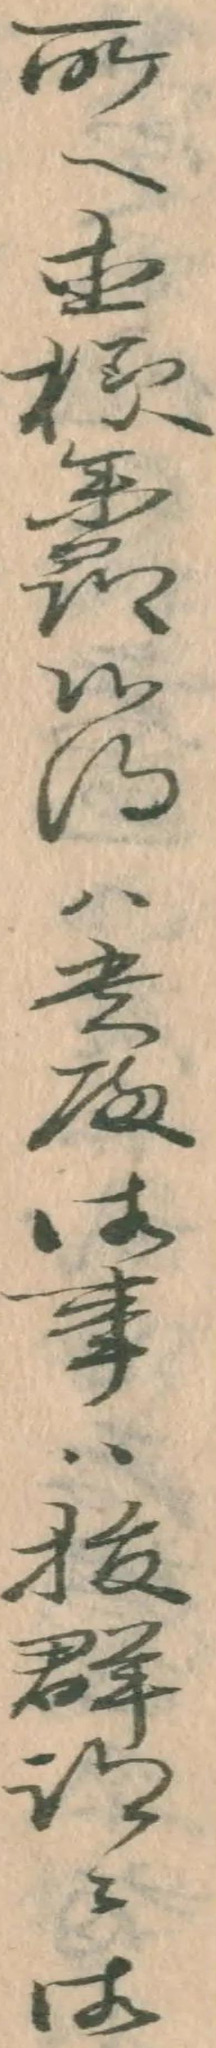所へ直様参尋候得は貴殿御事は抜群跡に御
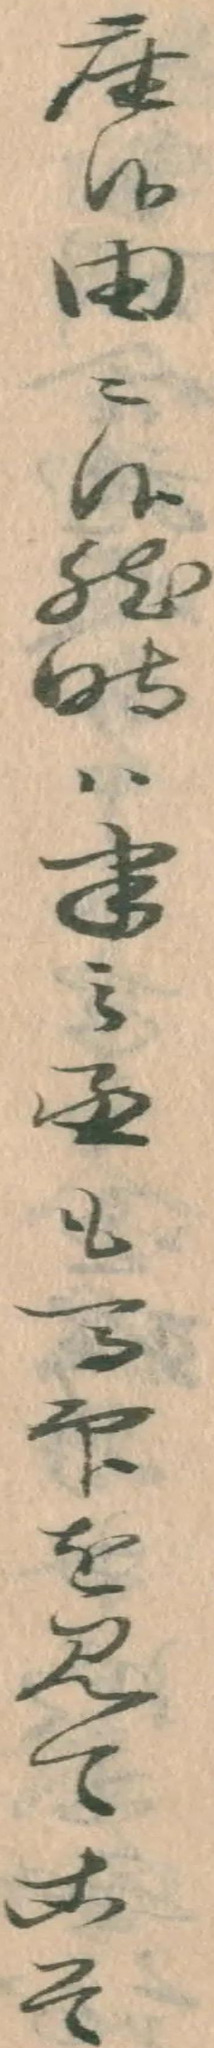座候由に候然時は半之丞も馬印を見て古そ
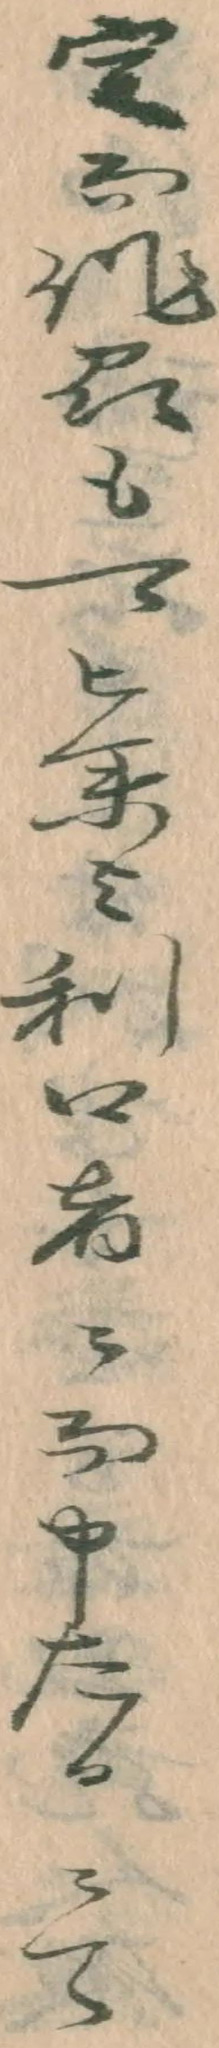定而作州も可被参与利口者に而申たるにて
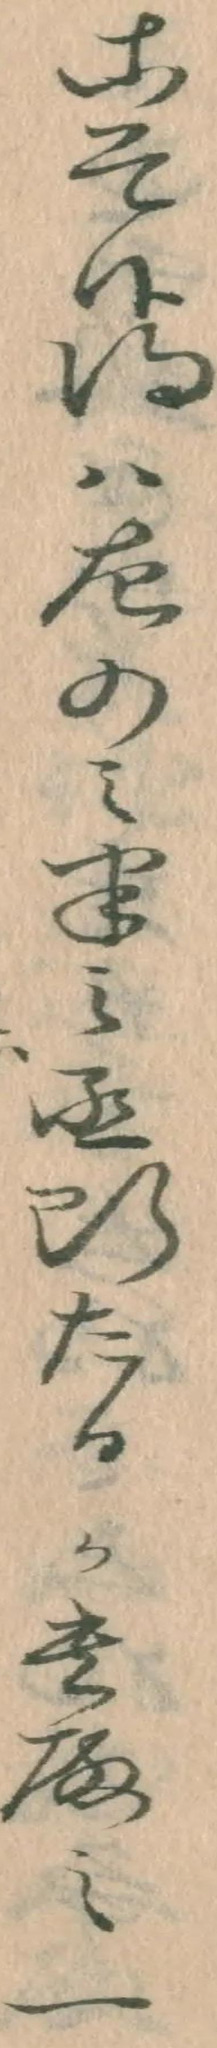古そ候得は左のみ半之丞断たるか貴殿之一
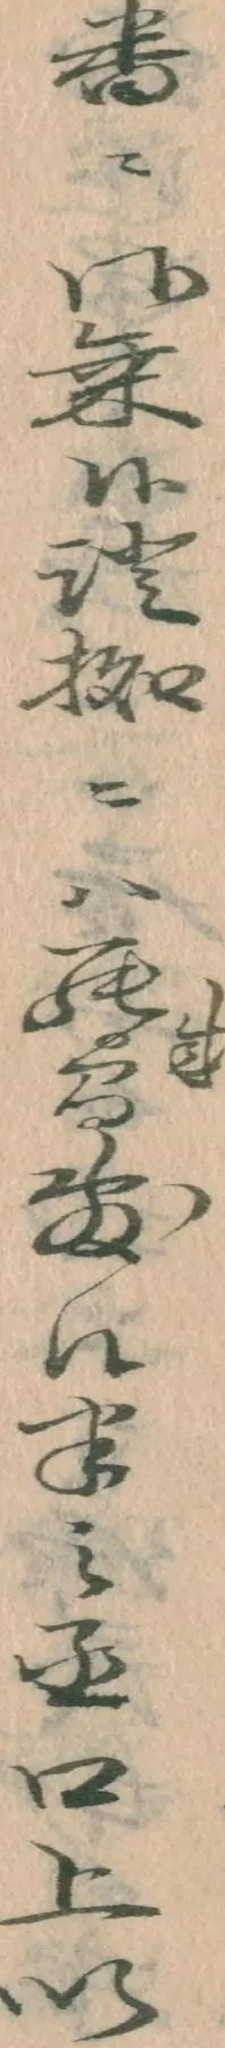番に御乗候証拠には罷間敷候半之丞口上以
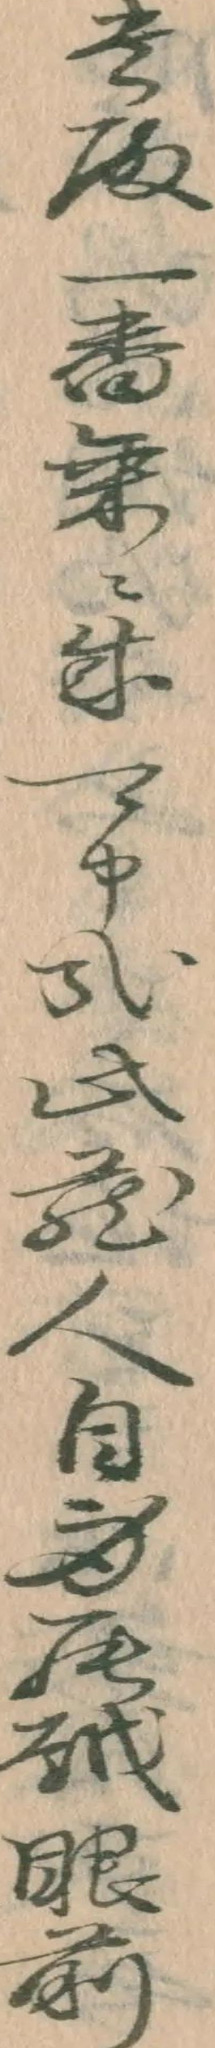貴殿一番乗に成可申哉此蔵人自身罷越眼前
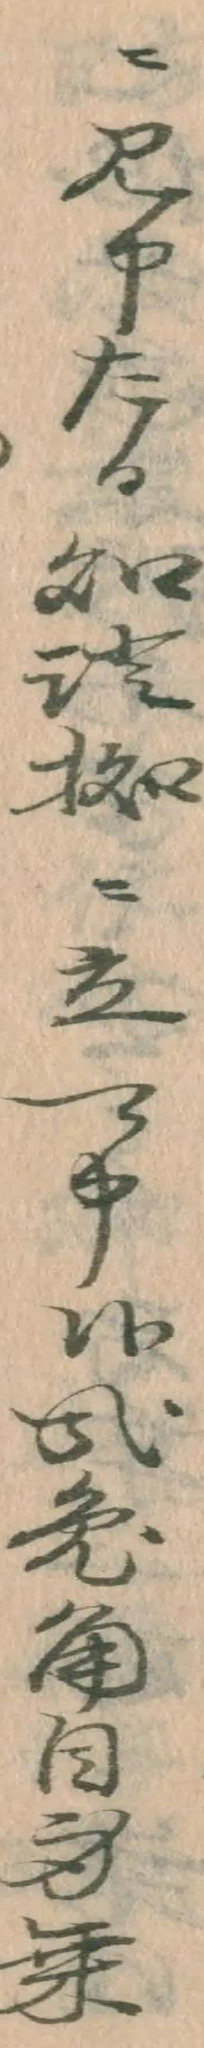に見申たる処証拠に立可申候哉兎角自身乗
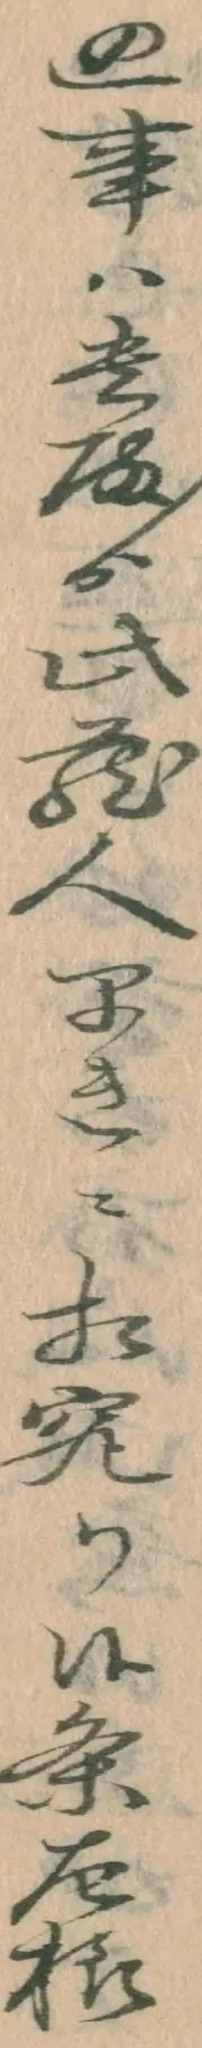込事は貴殿ゟ此蔵人早きに相究り候条左様
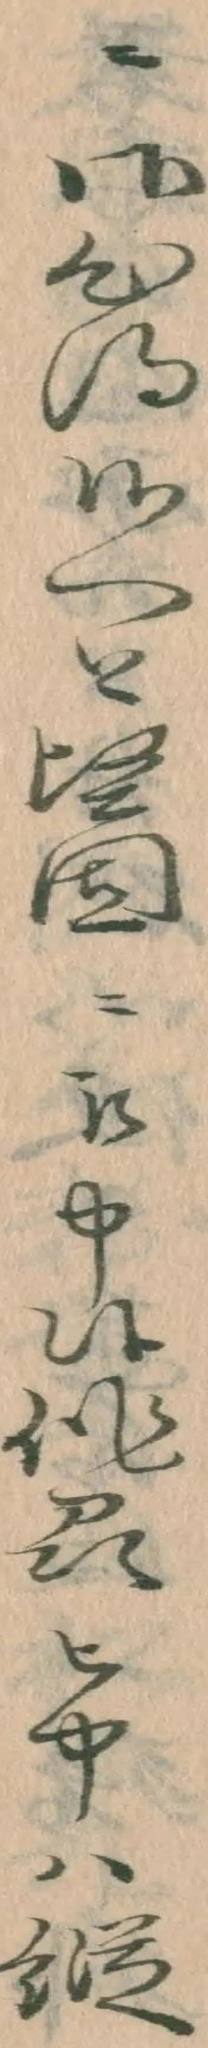に御心得候へと堅固に被申候作州と申は縦
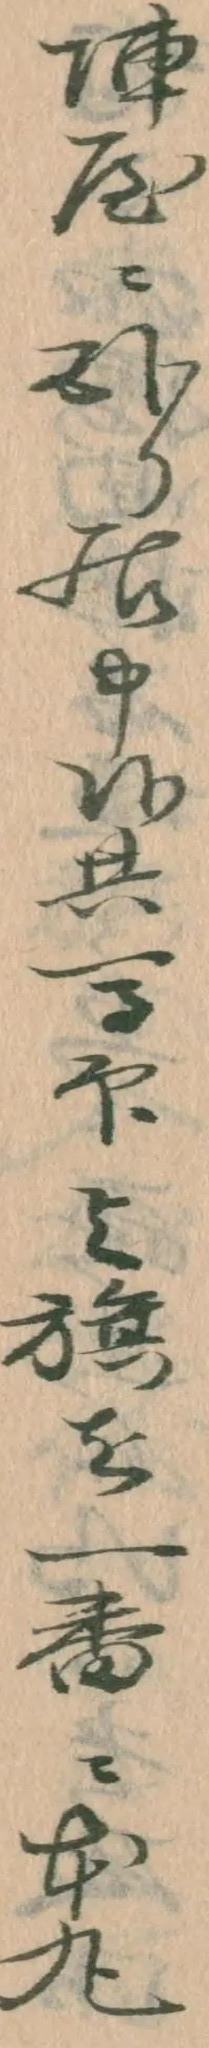陣屋に臥り居申候共馬印与旗を一番に本丸
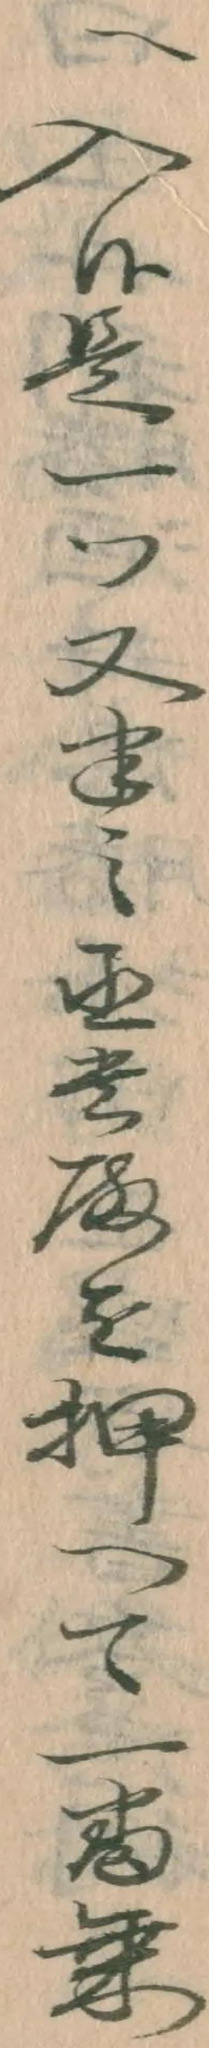へ入候是一つ又半之丞貴殿を押へて一番乗
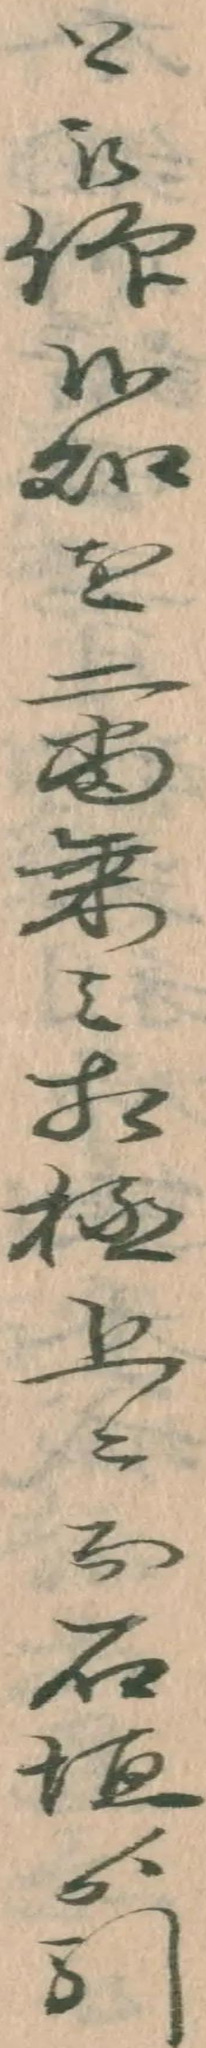と被仰候処を二番乗与相極上に而石垣ゟ引
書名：切支丹御退治記 49巻. [9]
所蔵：国立国会図書館 National Diet Library, JAPAN
